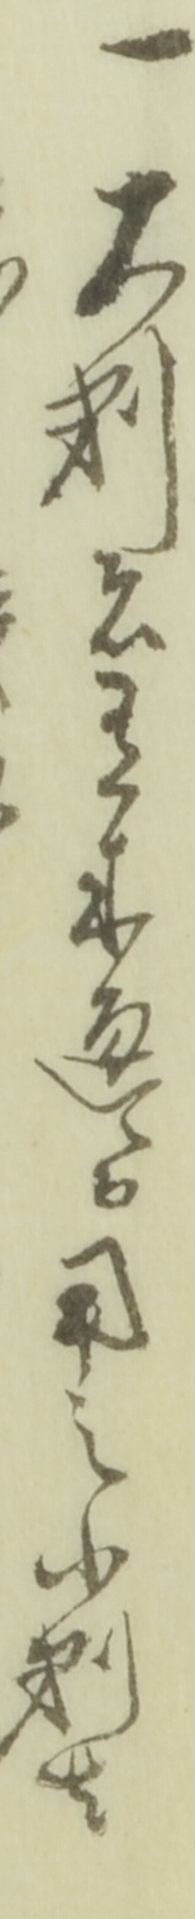一大判者有来通ニ而用之小判者
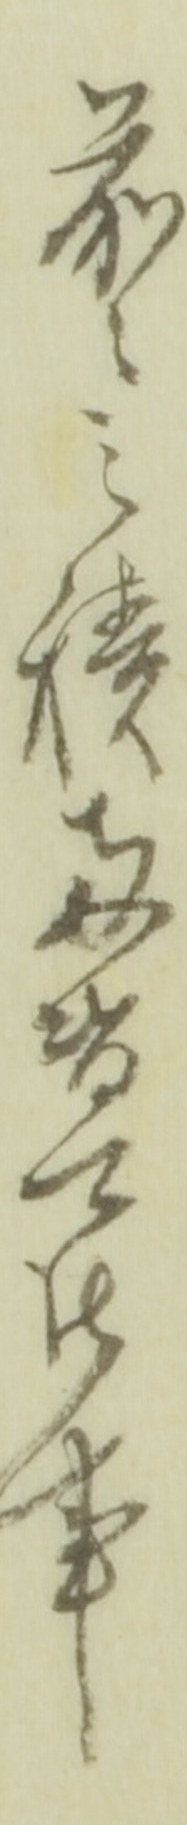前々之積両替可仕事
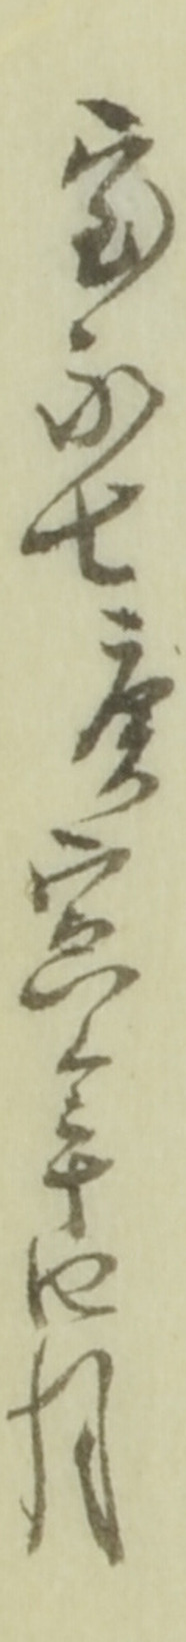宝永七年庚寅年四月
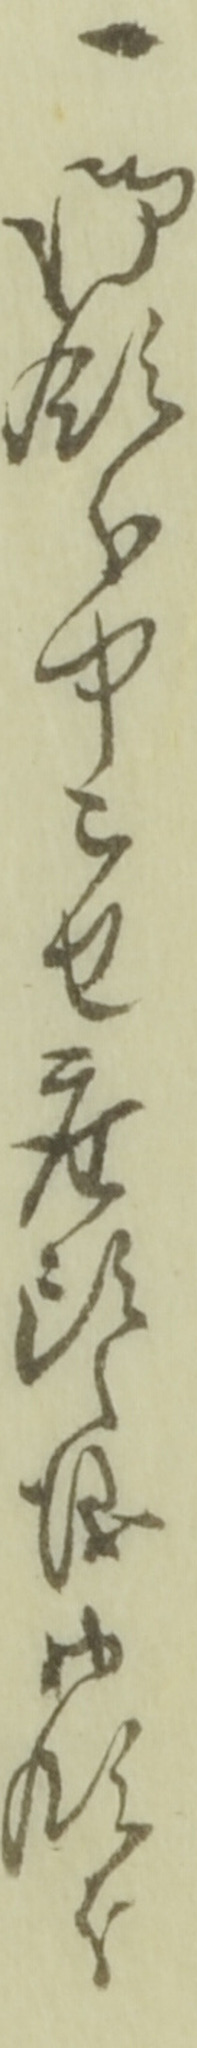一御領分中こせ座頭之儀御領分
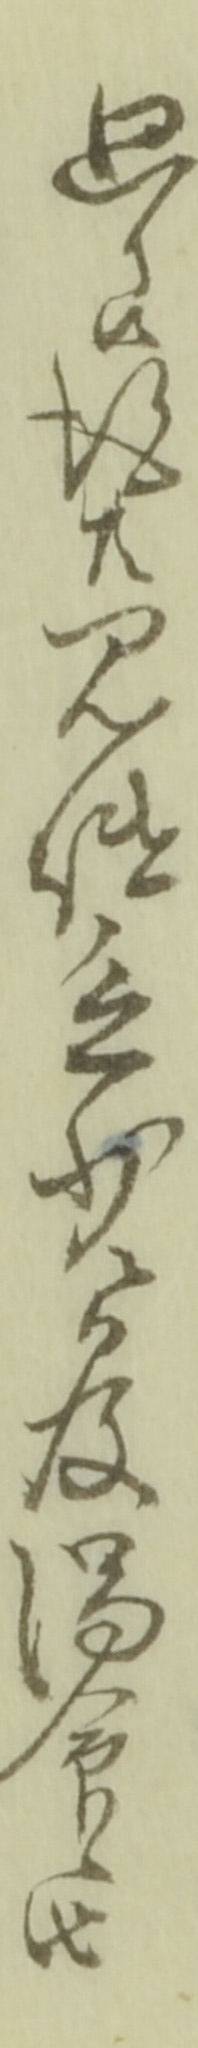廻り候得共見継乏少ニ而及渇命候由
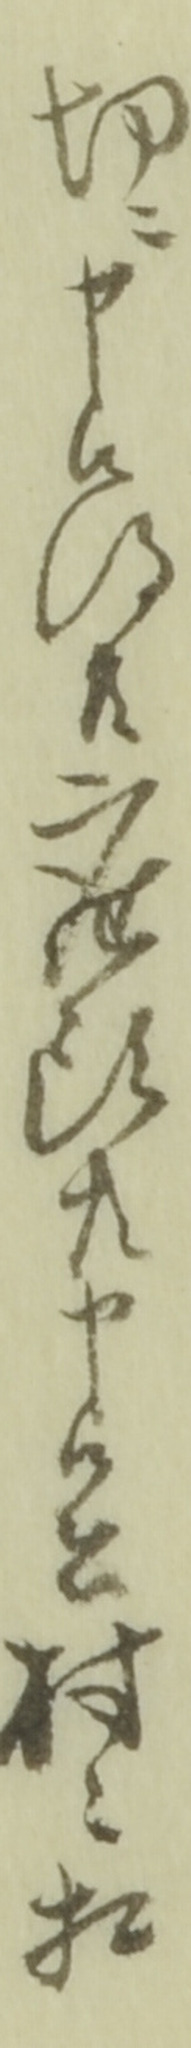切ニ申候得共座頭共申候者村々相
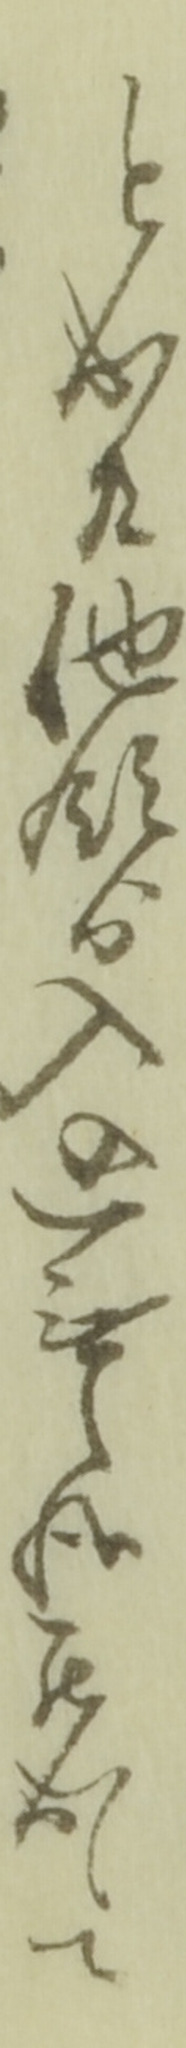と成共他領ゟ入込無之様罷成候はば
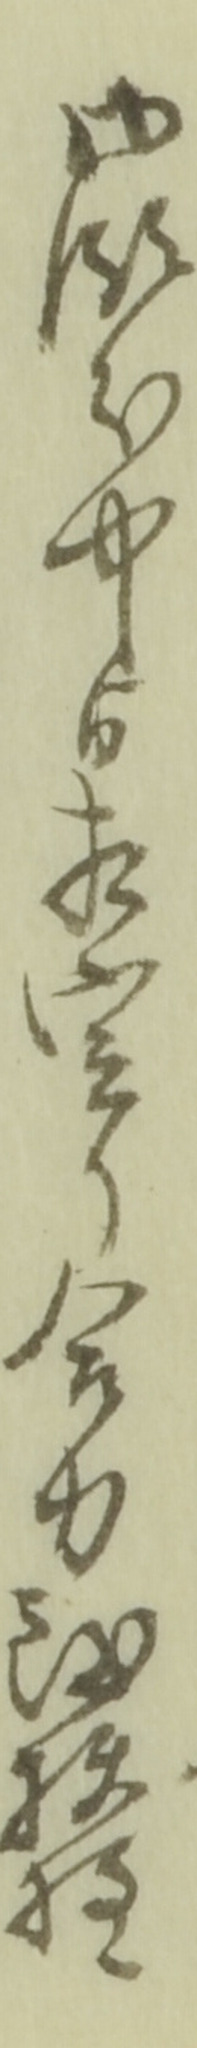御領分中ゟ相定り合力致扶持候
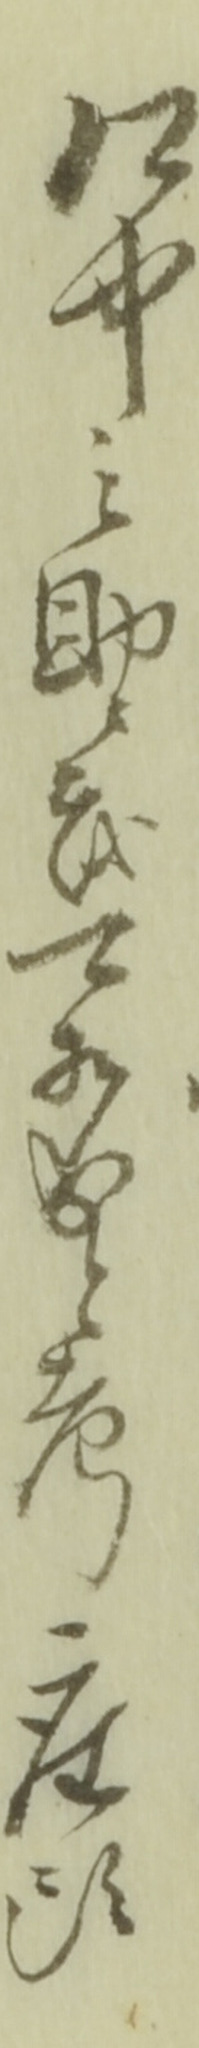郷中之助に茂可相成と考座頭
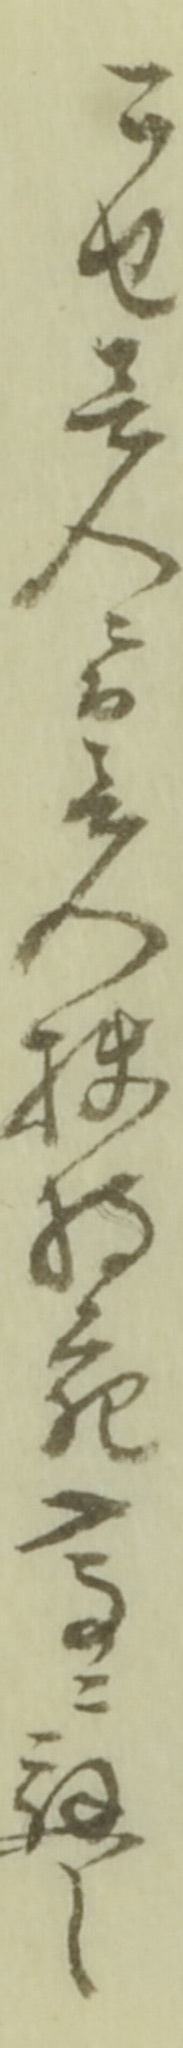こせ壱人二而壱人扶持宛高二応し
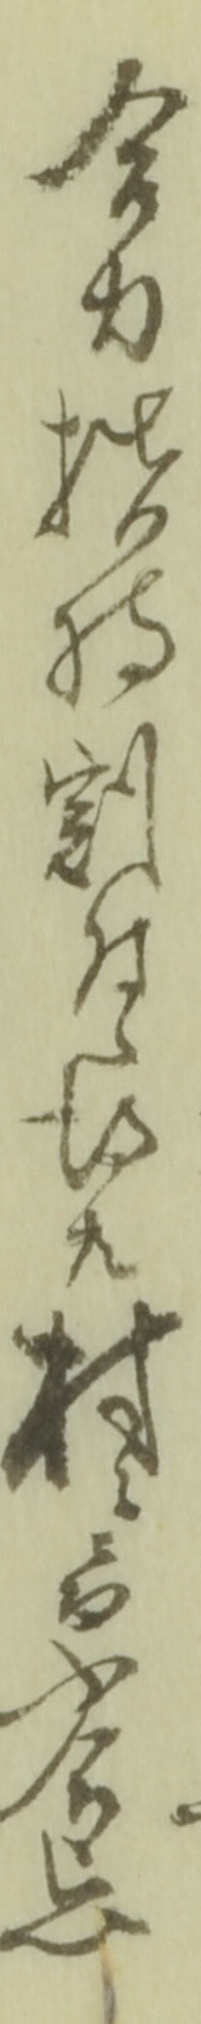合力指持割付候得共村々二而不合意
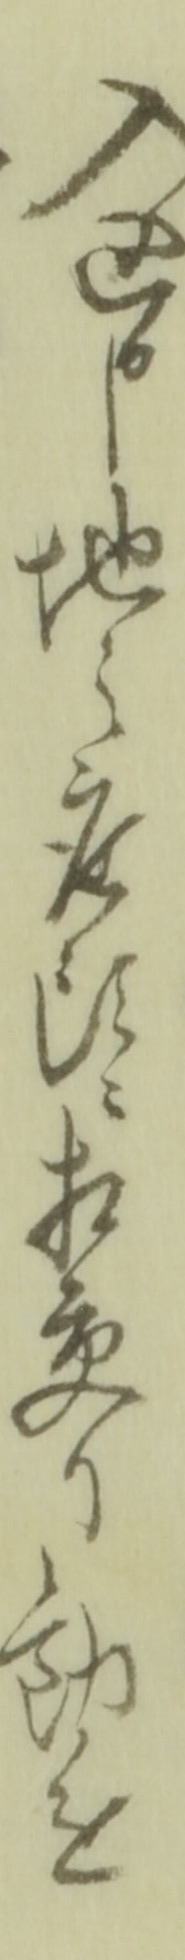入込申地之座頭二相交り勧進
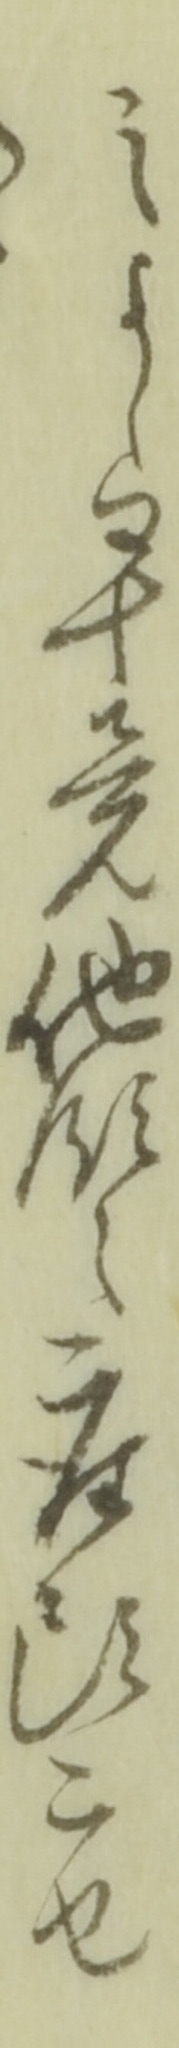之よし畢竟他領之座頭こせ
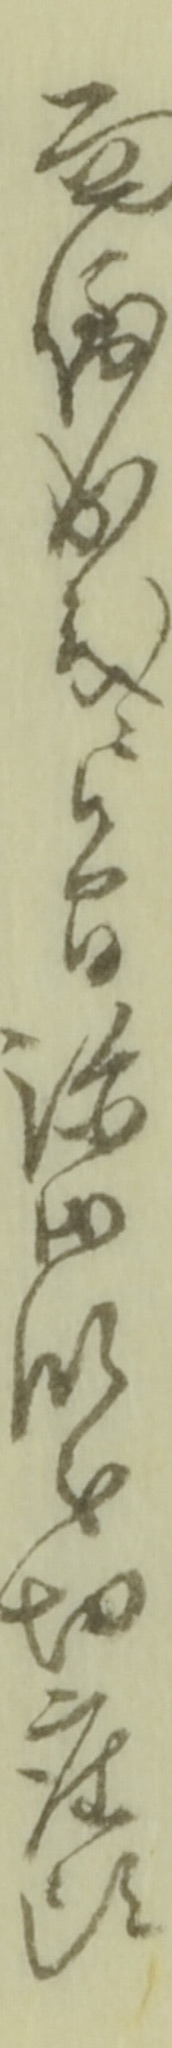面倒成儀ニ候間弥御領分切座頭
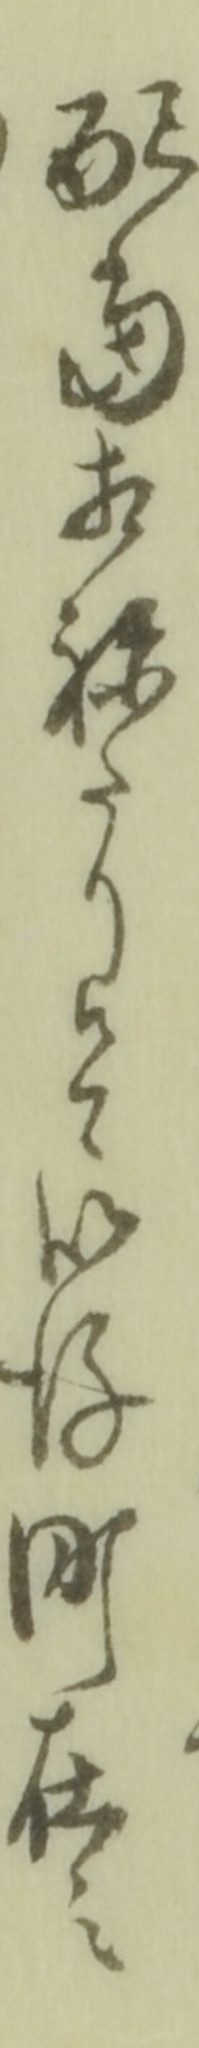配当相ねたり候はば以後町在之
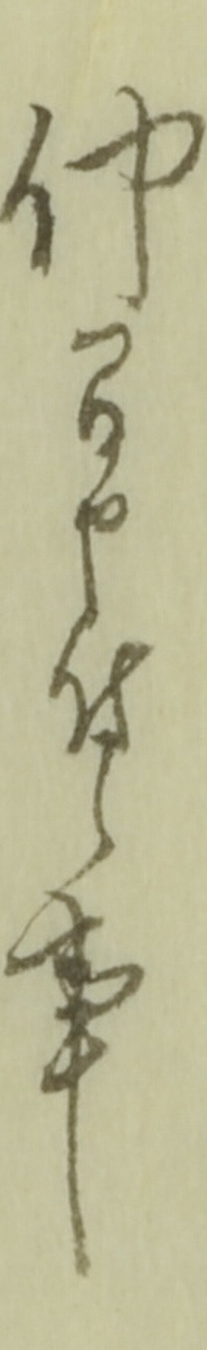仲間申付候事
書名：御公儀様御領主様御触書控
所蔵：伊那市立高遠町図書館・合同会社AMANE
